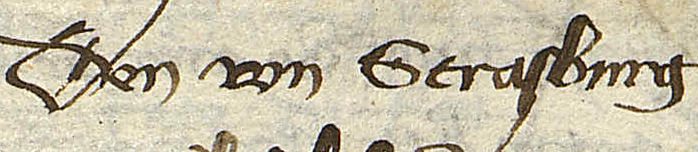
Den von Straſburg
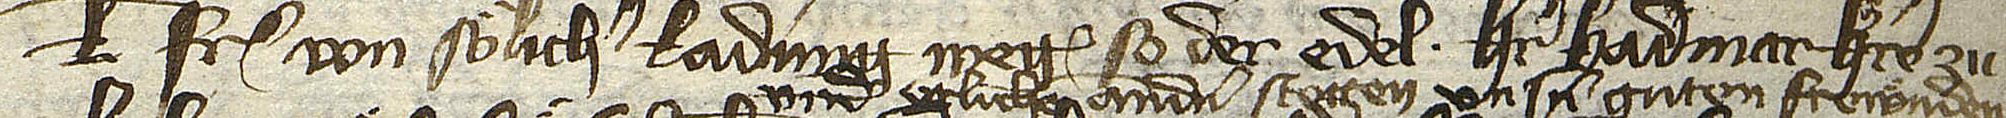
L* fr* von ſölich* ladung weg* ſo der edel . h*r hadmar h*re ʒu
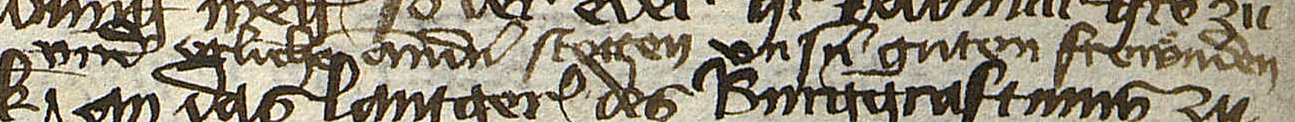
vnd etlichen and*n ſtetten vnſ*n guten frewnden
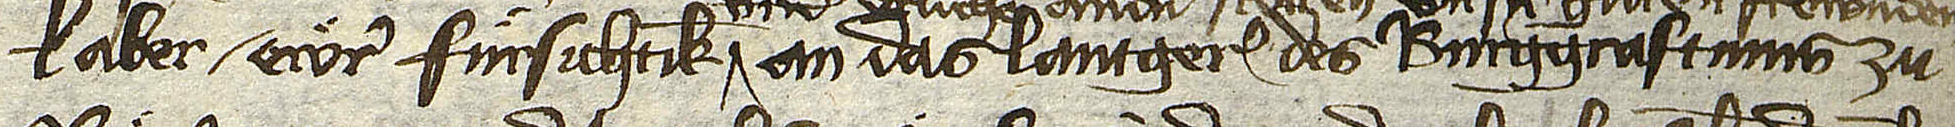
Laber / ewr fürſichtik* an das lantger* des Burggraftums ʒu
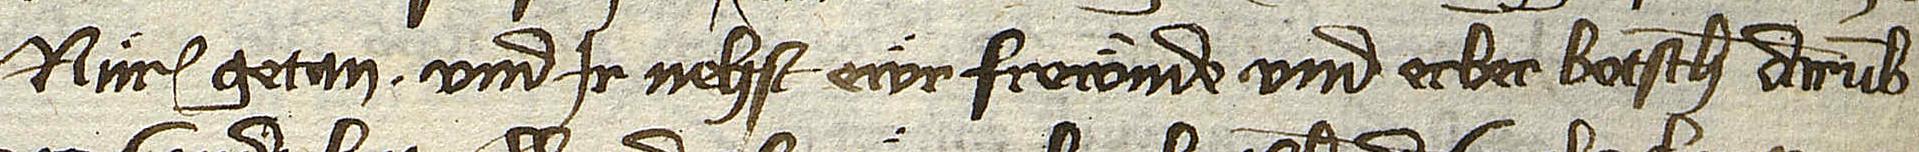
Nür* getan . vnd Ir nehſt ewr frewnde vnd erber botſch* daru*b
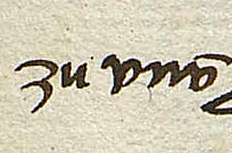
ʒu vns
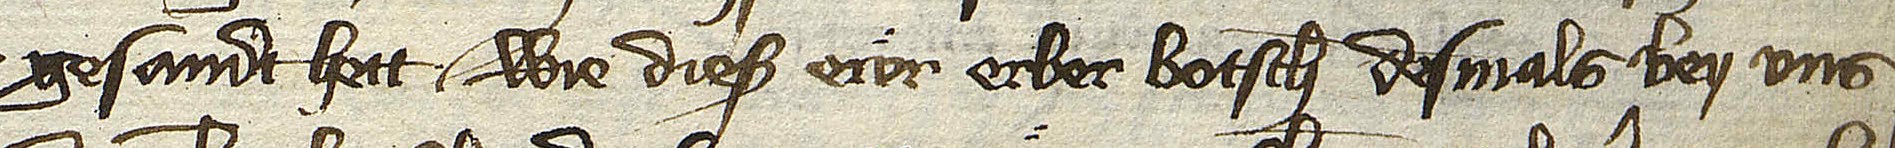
geſandt hett / Wie dieſ* ewr erber botſch* deſmals bey vns
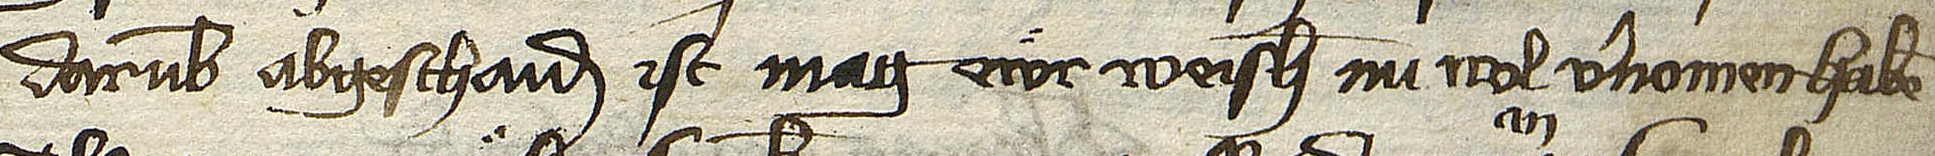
daru*b abgeſchaid* iſt mag ewr weiſh* nu wol v*nomen habe*
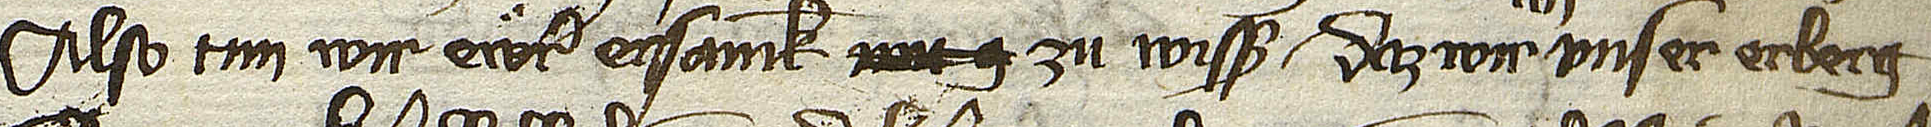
Alſo tun wir ewr* erſamk* mit g ʒu wiſſ* / daʒwir vnſer erberg
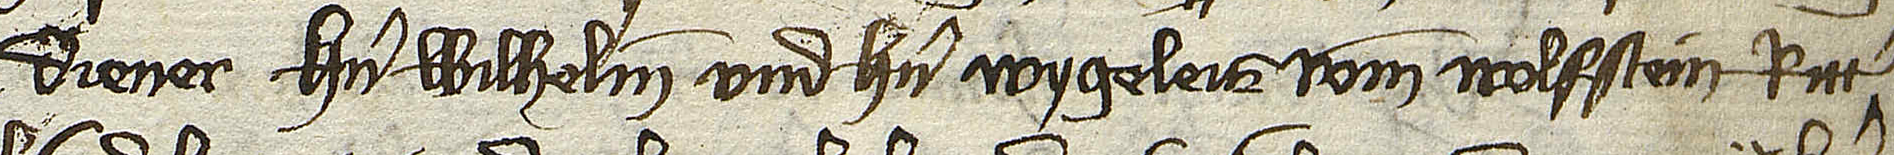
diener H*n Wilhelm* vnd h*n wygeleis vom wolfſtein Ritt*
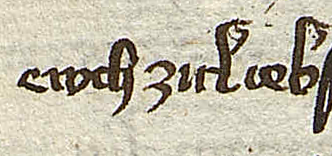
ewch ʒu lieb
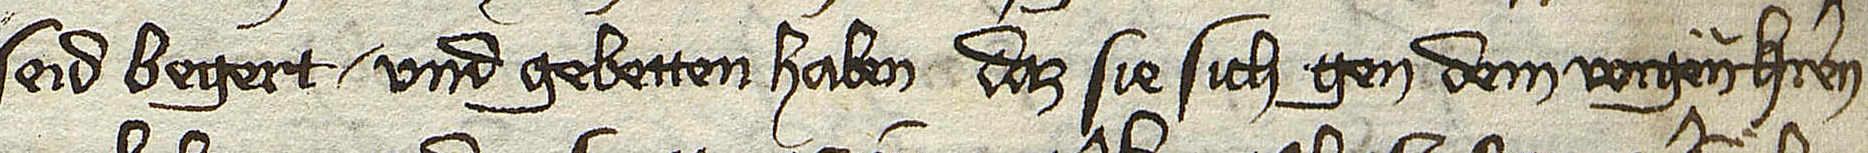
eid begert / vnd gebetten haben daʒ ſie ſich gen dem vorgen* h*ren
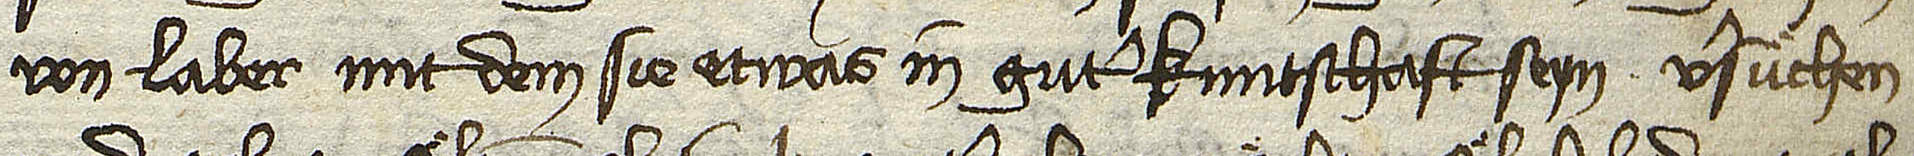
von laber mit dem ſie etwas in gut* kuntſchaft ſeyn . v*ſüchen
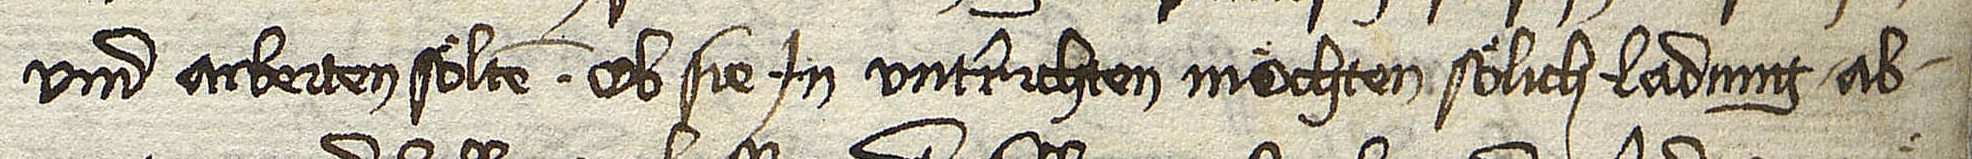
vnd arbeiten ſölte* . Ob ſie In vnt*richten möchten ſölich ladung / ab -
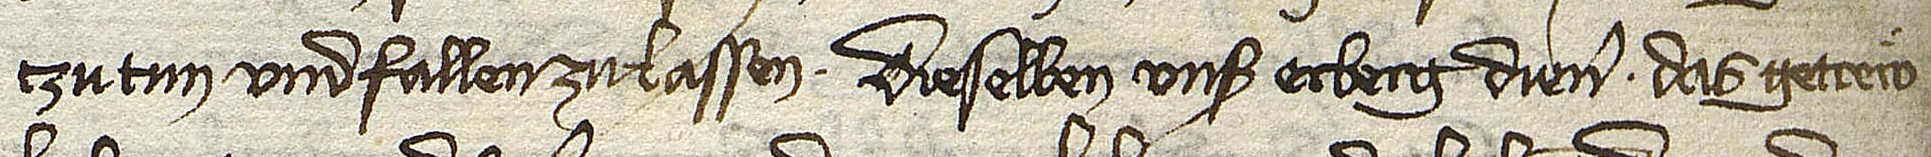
cʒu tun vnd fallen ʒu laſſen . Dieſelben vnſ* erberg dien* . das getrew
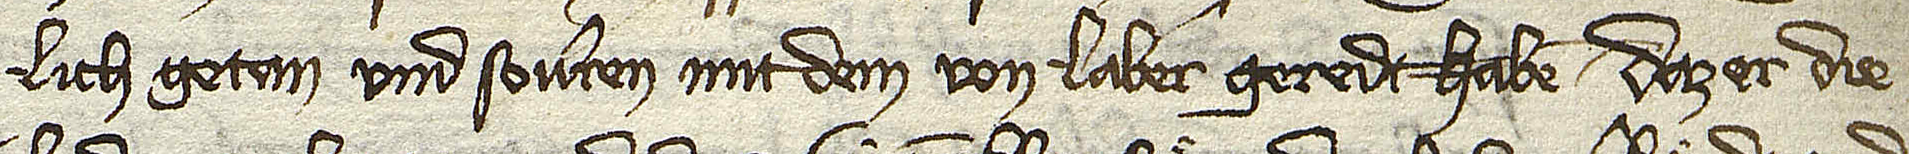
lich getan vnd ſou*ren mit dem von Laber geredt habe* / Daʒ er die
